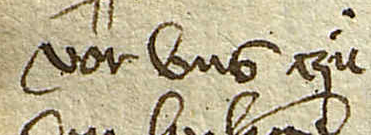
vor vns cʒü
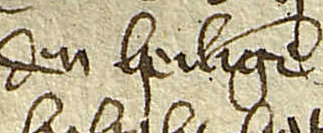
den heilige*
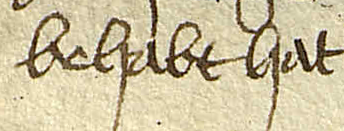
behabt hat
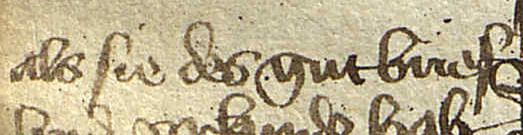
als ſie des gut brief
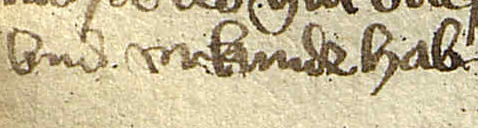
vnd vrkunde hab
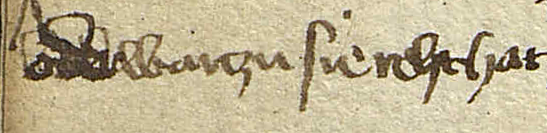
oder warcʒu ſie reht hat
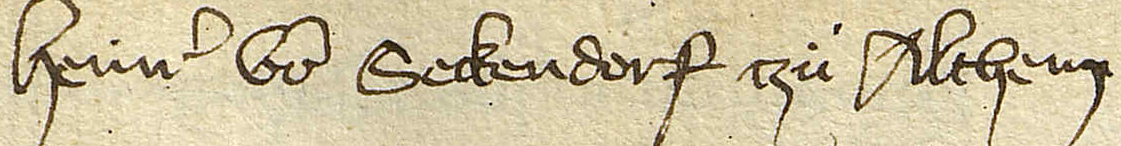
heinr* vo* Seckendorf cʒü Altheim
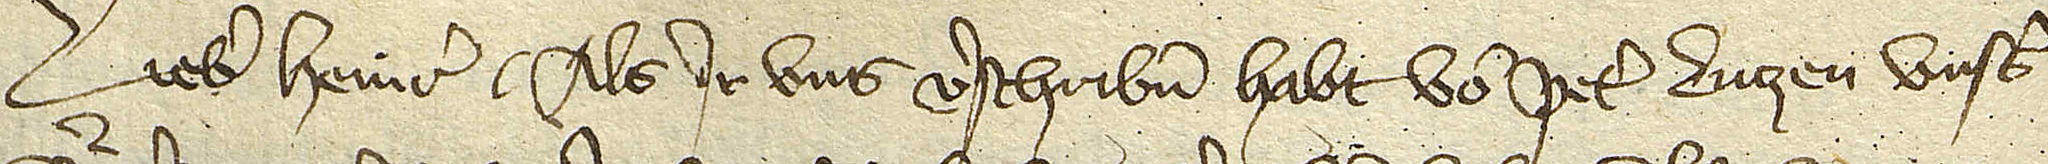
Lieb* heinr* / Als Ir vns v*ſchribn* habt vo* Pet* Lucʒen vnſs*
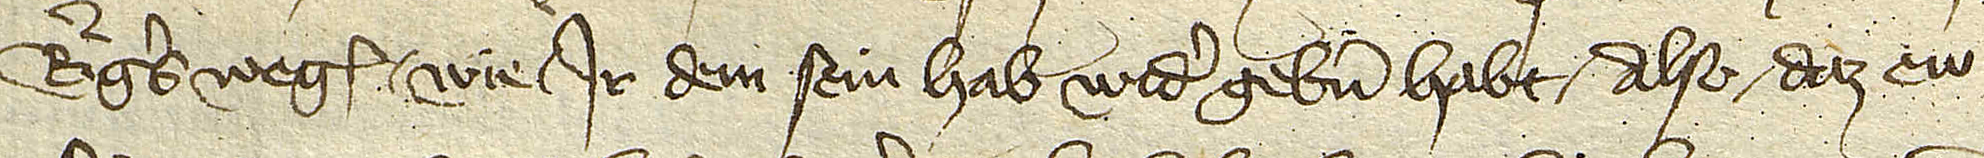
B*g*s weg* / wie Ir dem ſein hab wid* gebn* habt / Alſo / daʒ ew
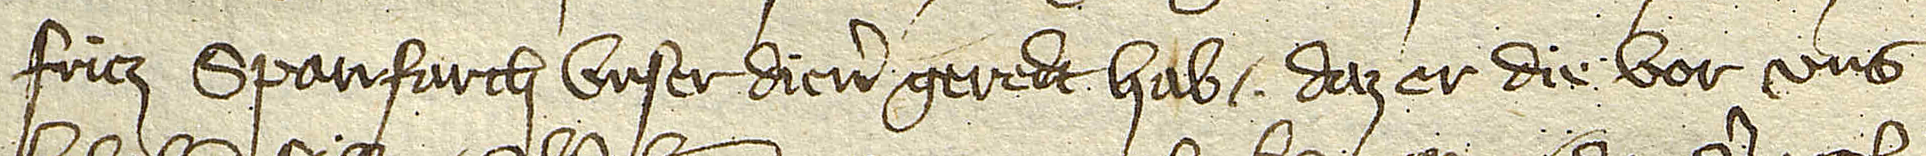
fricʒ Spanfarch vnſer dien* geredt hab / . daʒ er die vor vns
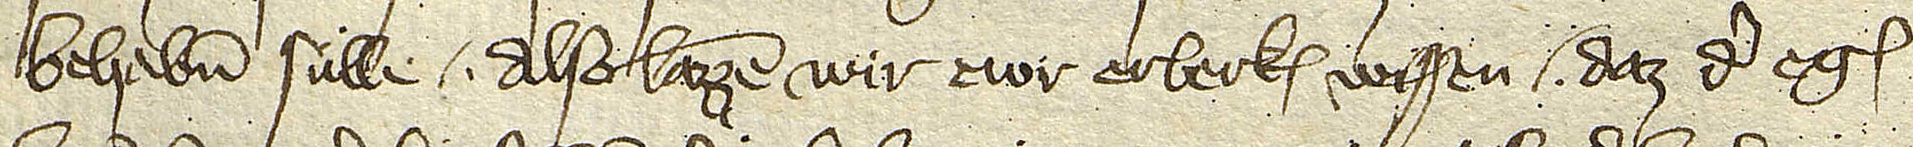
behabn* ſülle / . Alſo laʒʒe* wir ewr erberk* wiſſen / . daʒ d* eg*
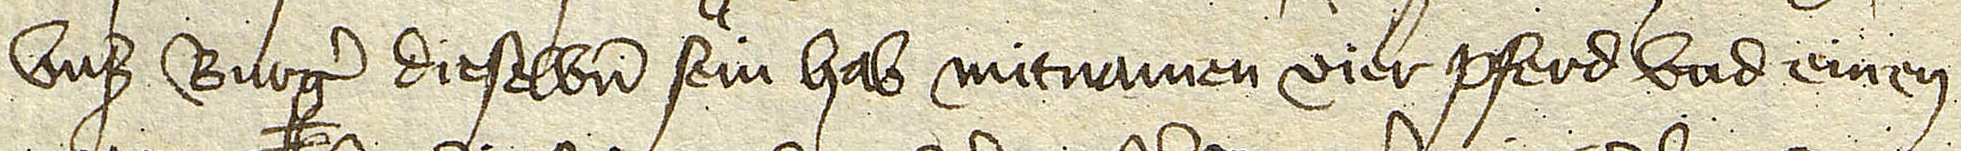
vnſ* Burg* dieſelbn* ſein hab mitnamen vier pferd vnd einen
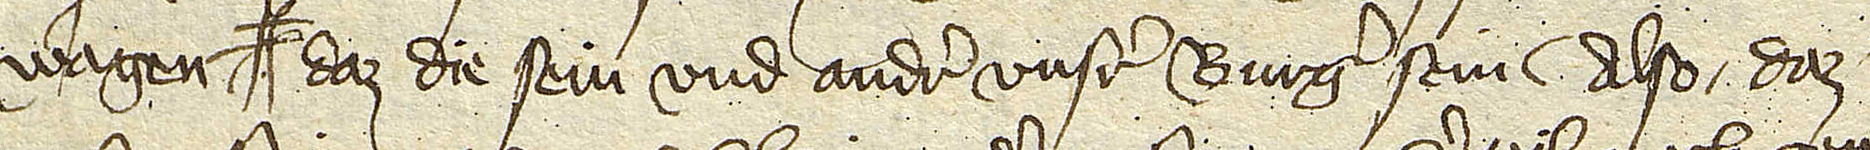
wagen / . daʒ die ſein vnd andr* vnſr* Burg* ſein / Alſo / daʒ
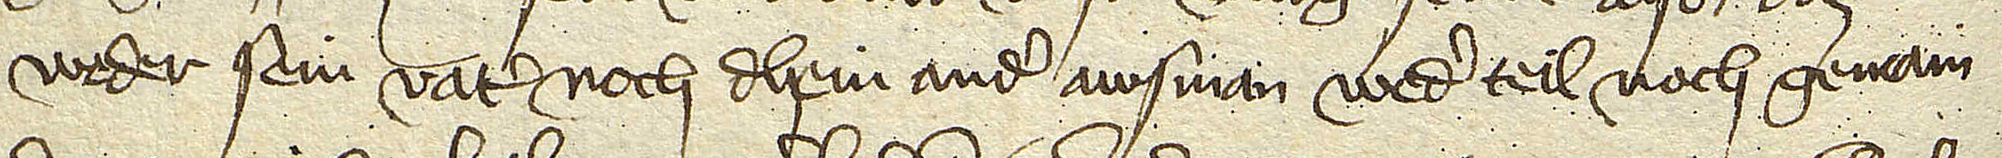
weder ſein vat* noch dhein and* awſman wed* teil noch gemain
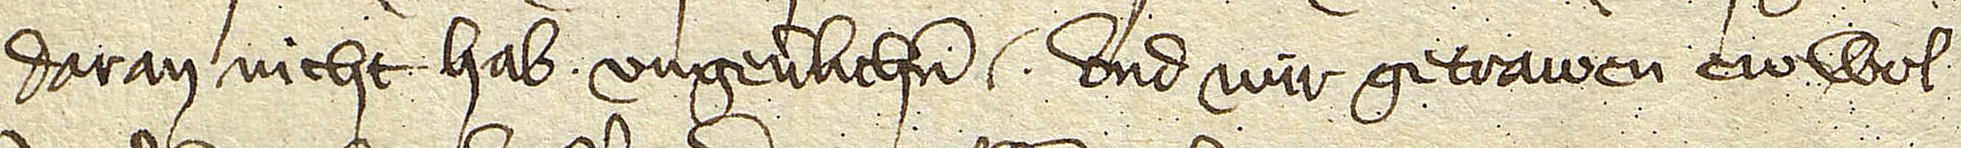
daran nicht hab vngeu*lichn* / . vnd wir getrawen ew wol
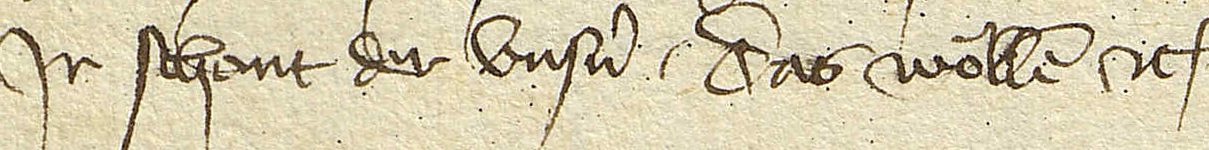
Ir ſchont der vnſn* / Das wölle* ec*
